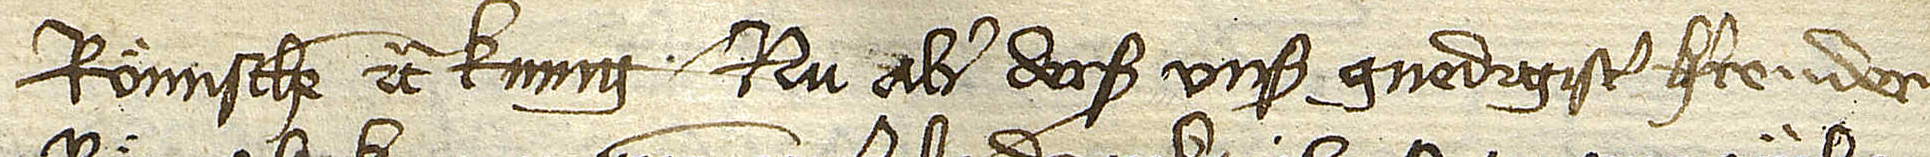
Römiſche* ec* kunig . / Nu ab* derſ* vnſ* gnedigiſt* h*re ~ der
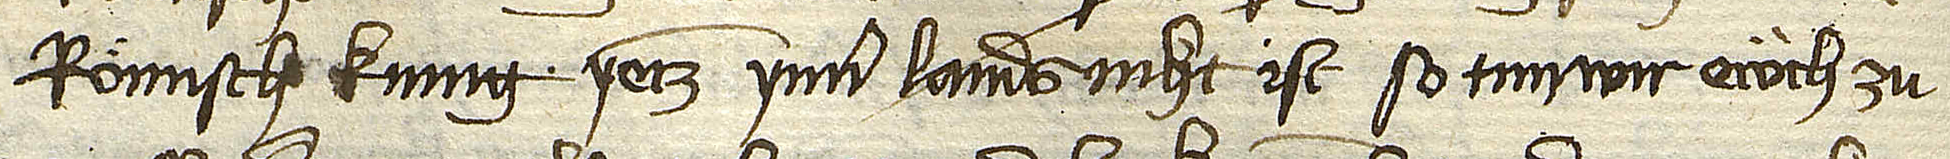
Römiſch kunig . yecʒ* ynn* lands niht iſt ſo tun wir ewch ʒu
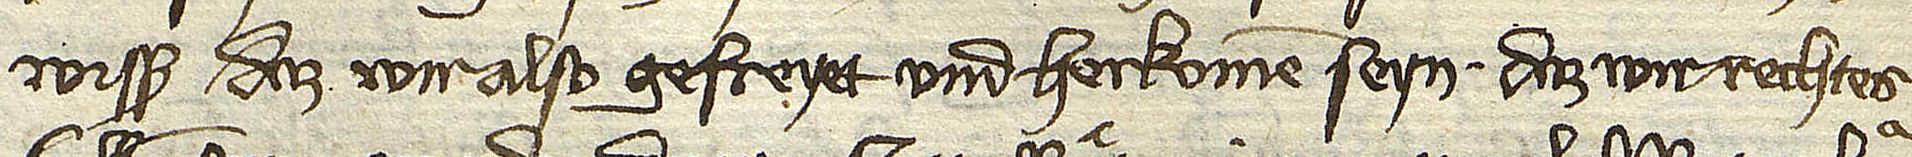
wiſſ* / daʒ wir alſo gefreyet vnd herkome* ſeyn . daʒ wir rechtes
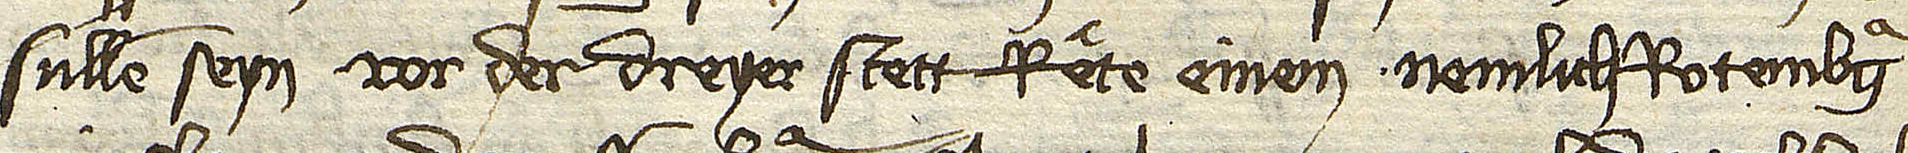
ſulle* ſeyn . vor der dreyer ſtett Rëte einem . nemlich Rotemb*g
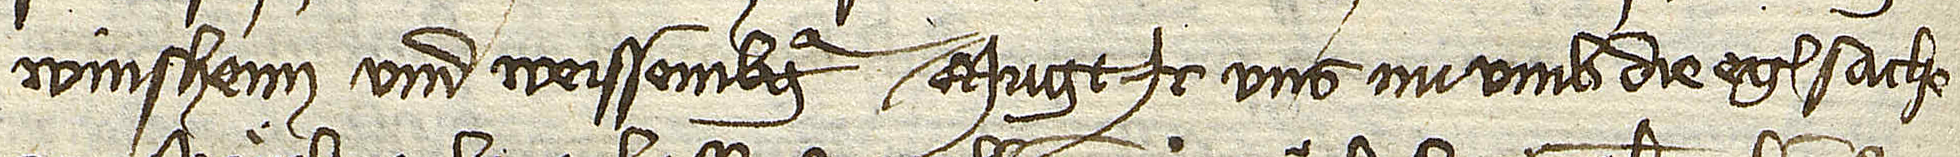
winſheim vnd weiſſemb*g / Mugt Ir vns nu vmb die eg* ſache
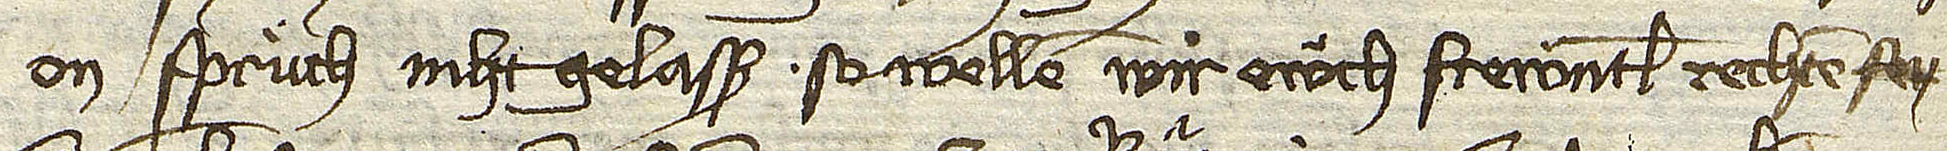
on ſprüch niht gelaſſ* . ſo welle* wir ewch frewntl* rechte* ſey
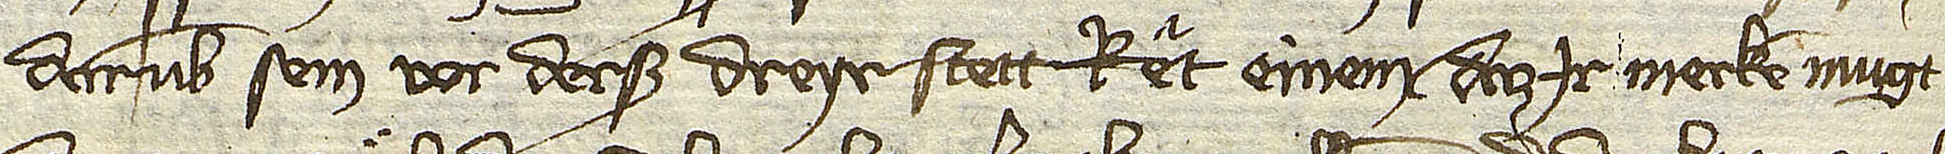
daru*b ſein vor derſ* dreyr ſtett Rët einem / daʒ Ir merke* mugt
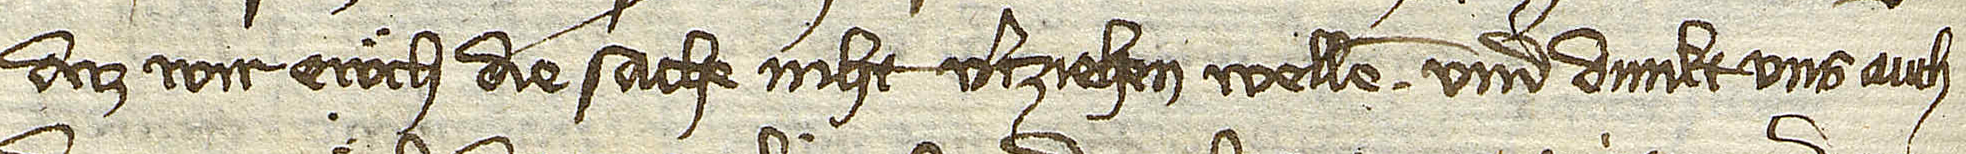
daʒ wir ewch die ſache niht v*cʒiehen welle* . vnd dunkt vns auch
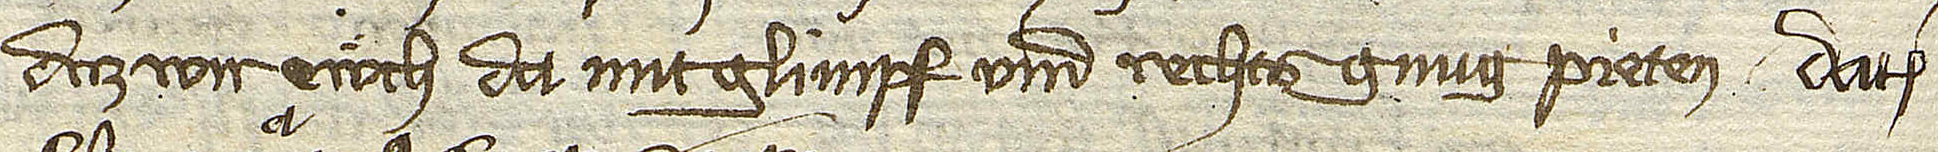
daʒ wir ewch da mit glimpf vnd rechts gnug pieten / dat*
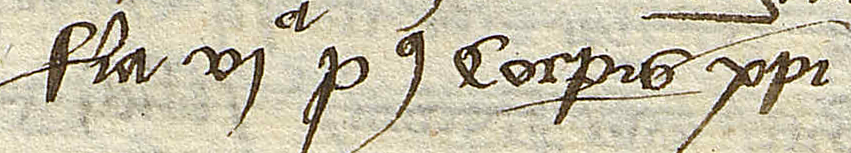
fia* vi* p* Corp*is xpi*
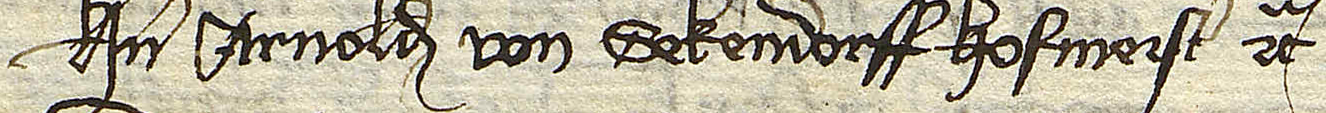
H*n Arnold* von Sekendorff hofmeiſt* ec*
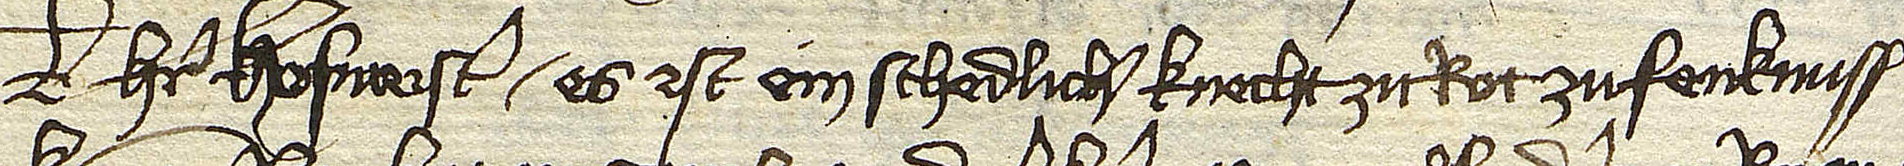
L* h*r Hofmeiſt* / es iſt ein ſchedlich* knecht ʒu Rot ʒu fenknuſſ
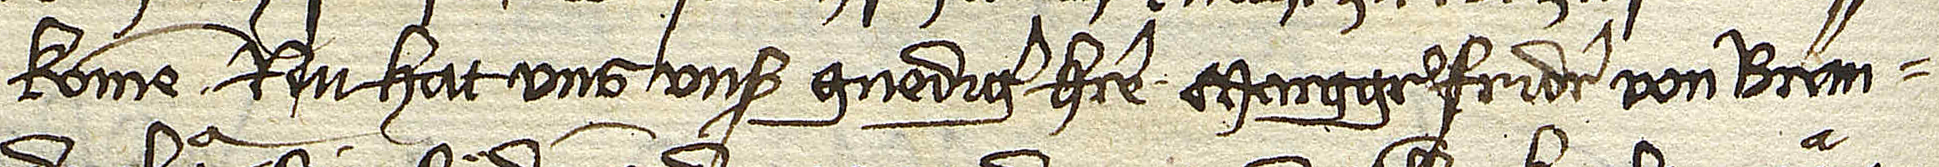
kome* . Nu hat vns vnſ* gnedig* h*re . Marggr* Fridr* von Bran =
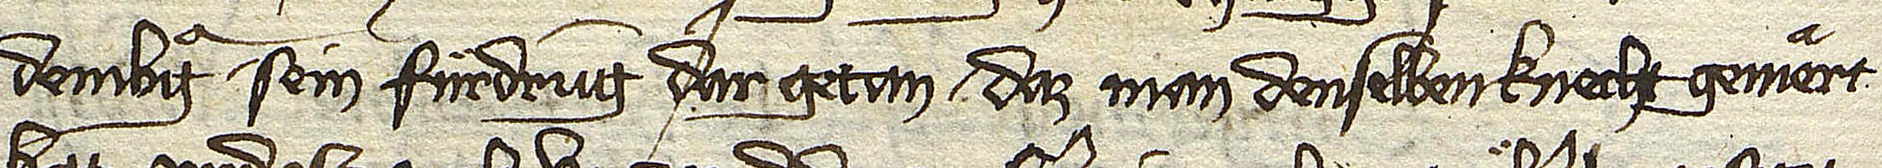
demb*g / ſein fürdru*g dar getan / daʒ man denſelben knecht gemërt
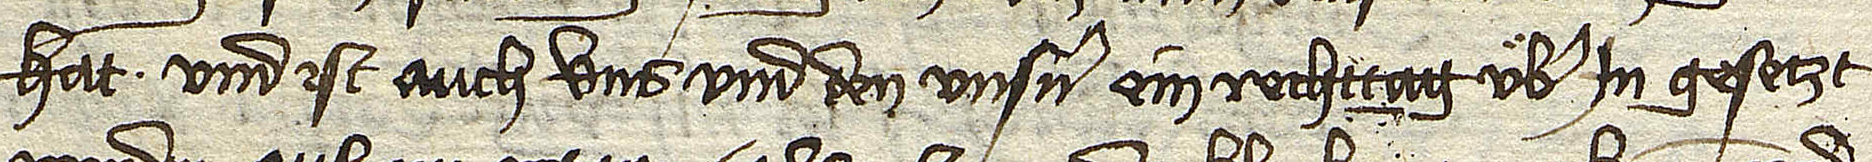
hat . vnd iſt auch Vns vnd den vnſ*n ein rechttag v̈b* In geſecʒt
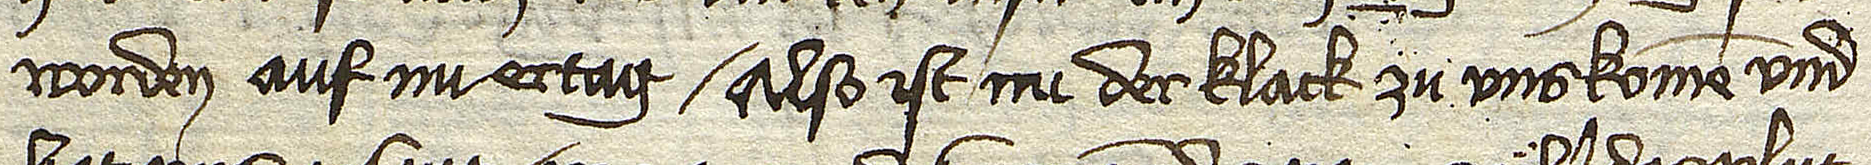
worden auf nu ertag / Alſo iſt nu der klack ʒu vns kome* vnd
